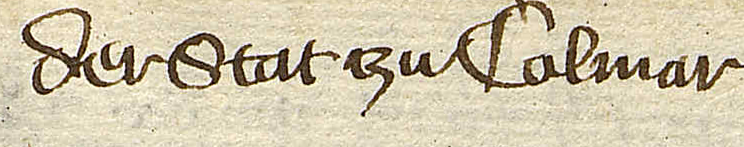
Der Stat cʒu Colmar
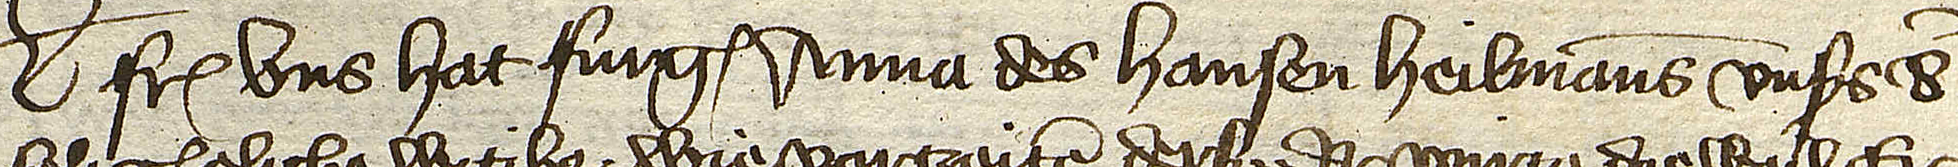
L* fr* vns hat furg* Anna des hanſen heilman*s vnſ*s B*
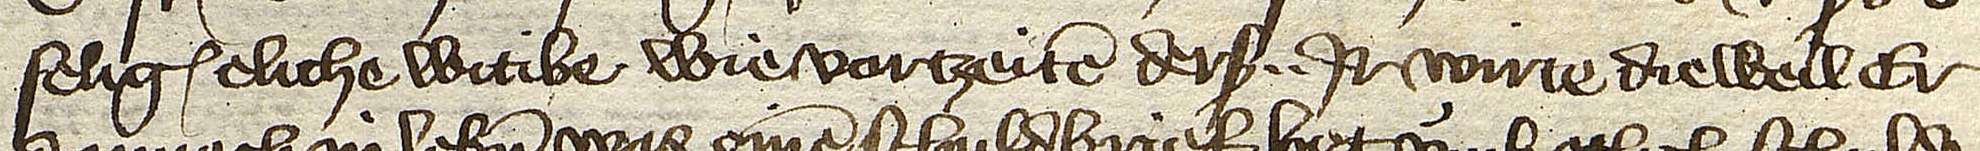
ſelig* eliche witibe . wie vorcʒeite* derſ* ~ Ir wirte dieweil Er
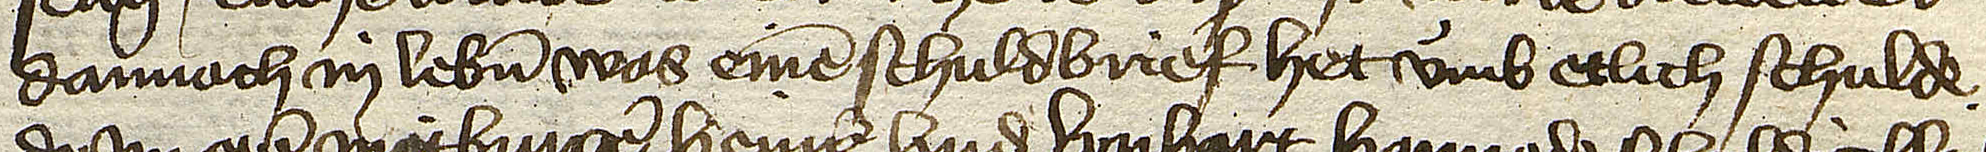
dannoch in lebn* was eine* ſchuldbrief het v̈mb etlich ſchulde
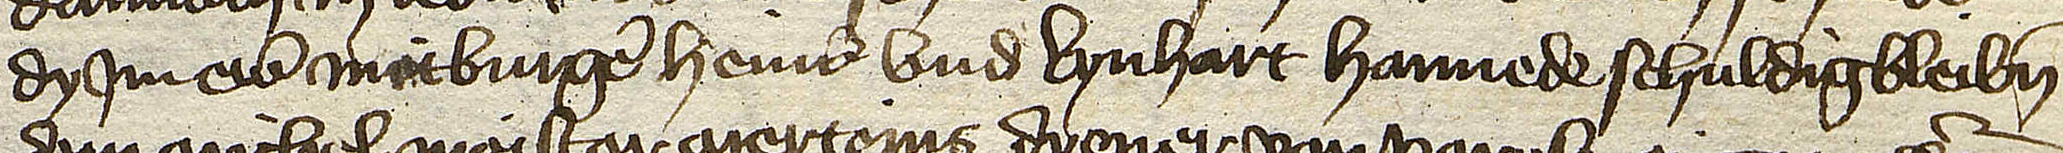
dy Im ew* mitburge* heinr* vnd lynhart hannede ſchuldigbleibn*
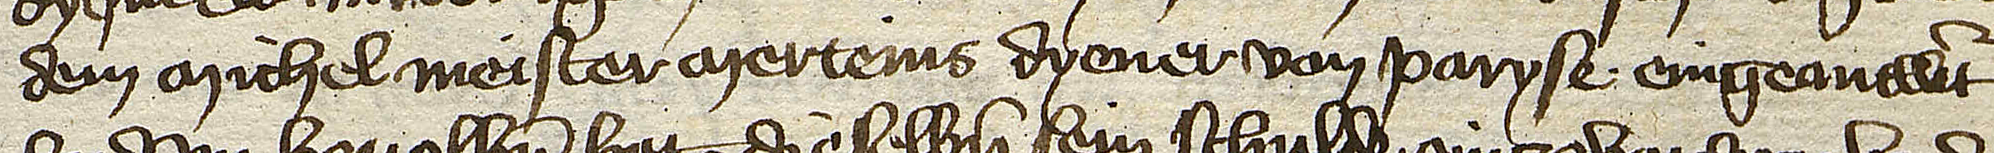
dem Michel meiſter Merteins dyener von paryſe . eingeantw*t
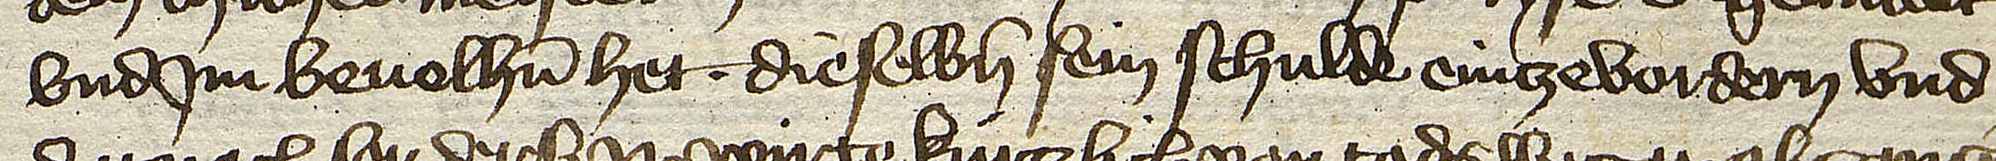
vnd Im beuolhn* het . dieſelbn* ſein ſchulde eincʒuvordern vnd
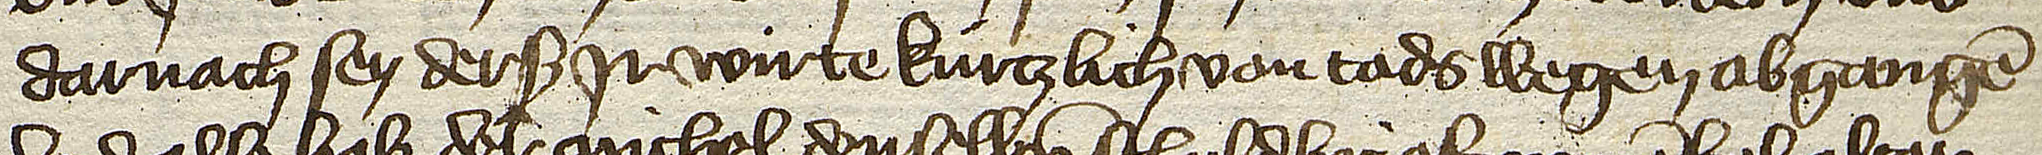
darnach ſey derſ* Ir wirte kürcʒlich von tods wegen abgange*
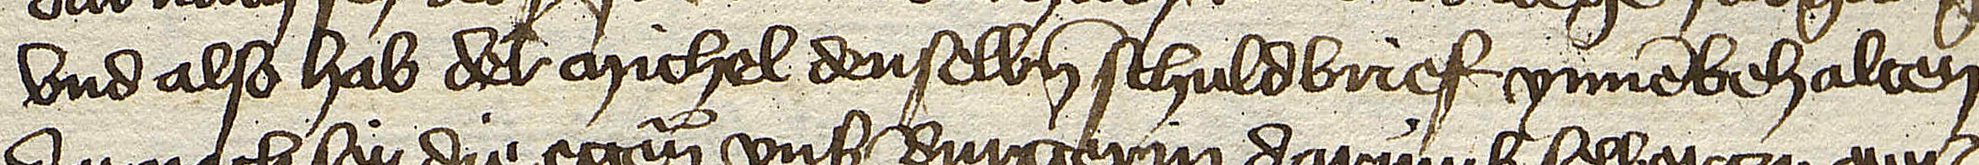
vnd alſo hab der Michel denſelbn* ſchuldbrief ynne*behalten
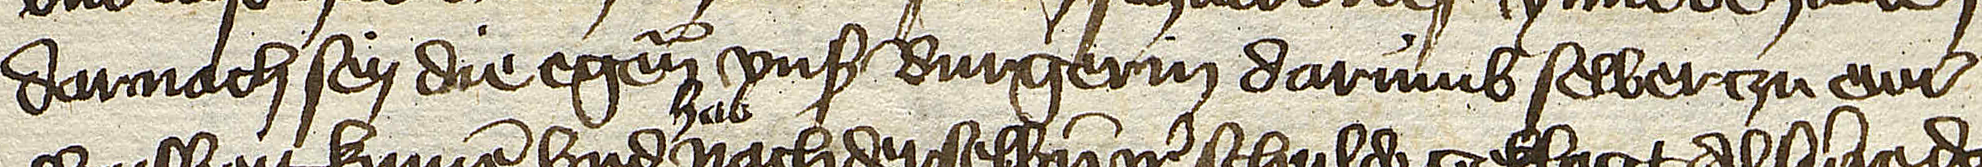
Darnach ſey die egen* vnſ* Burgerin darümb ſelber cʒu ewr*
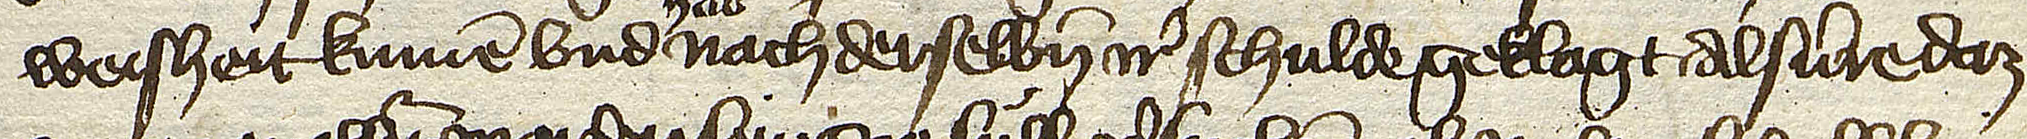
weiſheit kume* vnd nach derſelbn* ir* ſchulde geklagt / Alſu*re daʒ
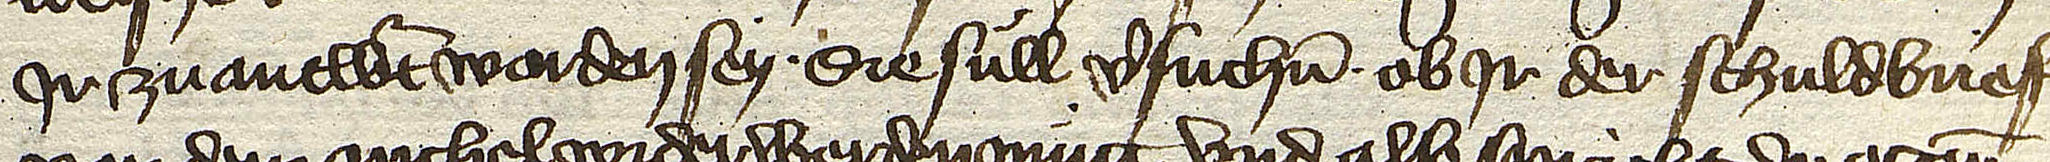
Ir cʒu antw*t worden ſey . Sie ſüll v*ſuchn* . ob Ir der ſchuldbrief
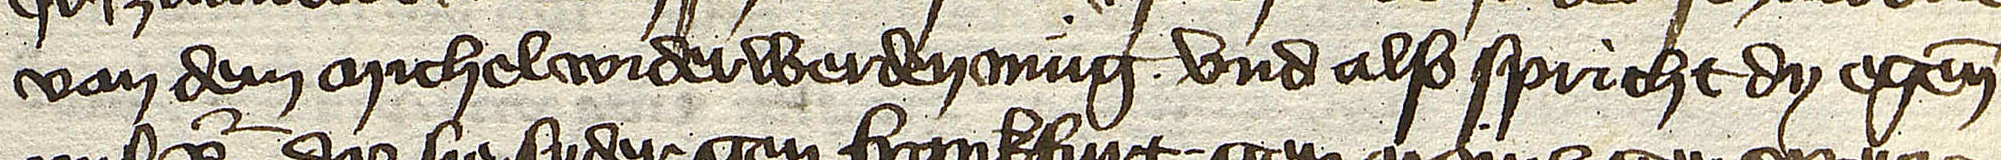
von dem Michel wider werden müg . vnd alſo ſpricht dy egen*
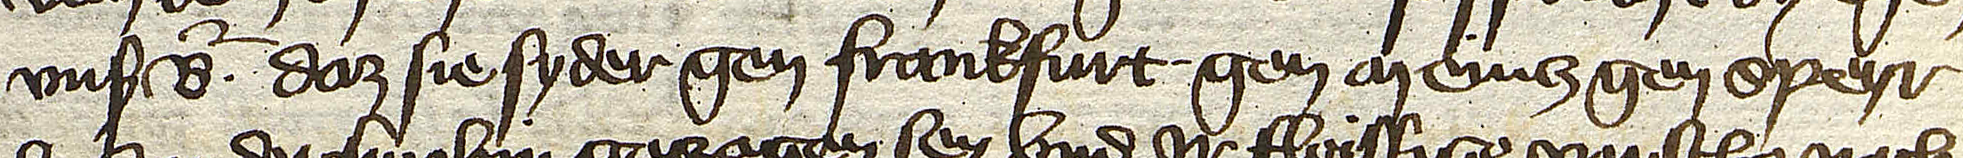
vnſ* B* . daʒ ſie ſyder gen frankfurt . gen Meincʒ gen Speyr
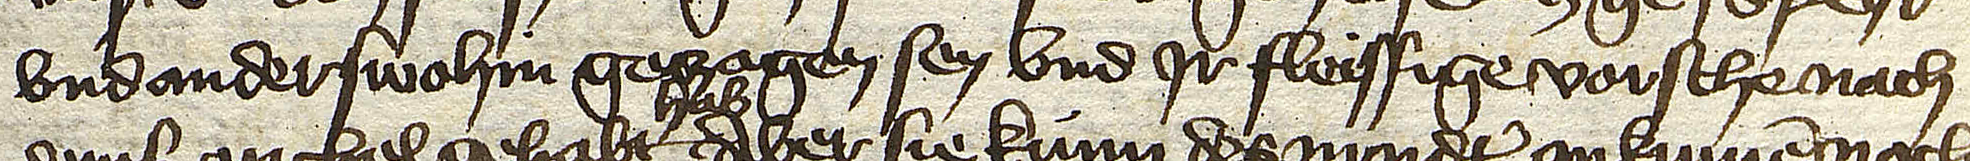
vnd anderſwohin gecʒogen ſey vnd Ir fleiſſige vorſche nach
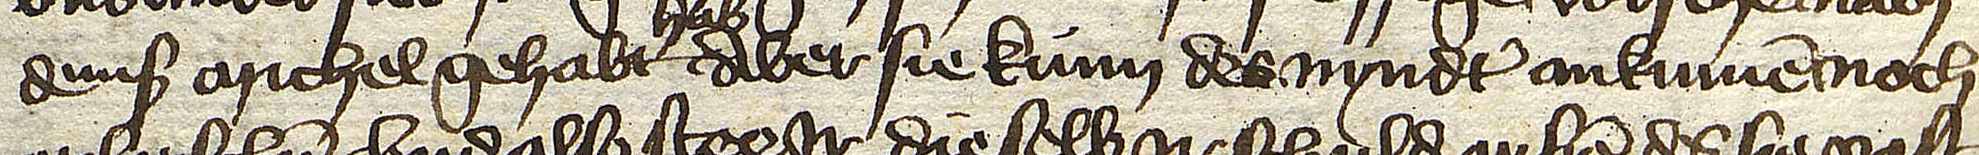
demſ* Michel gehabt / Aber ſie künn des nynd*t ankume* noch
